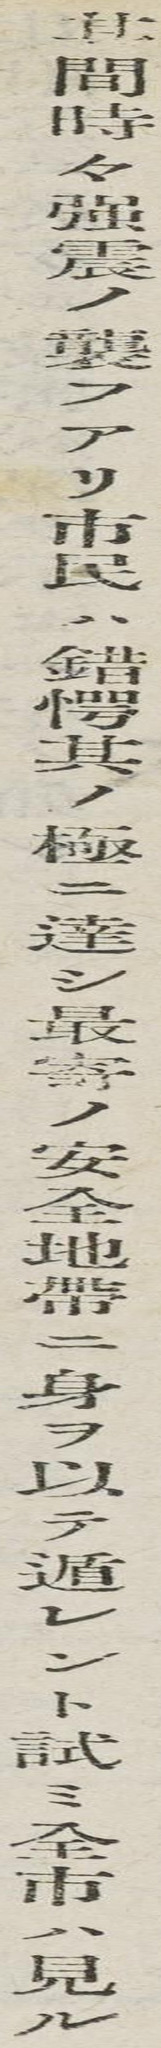其間時々強震ノ襲フアリ市民ハ錯愕其ノ極ニ達シ最寄ノ安全地帯ニ身ヲ以テ遁レント試ミ全市ハ見ル
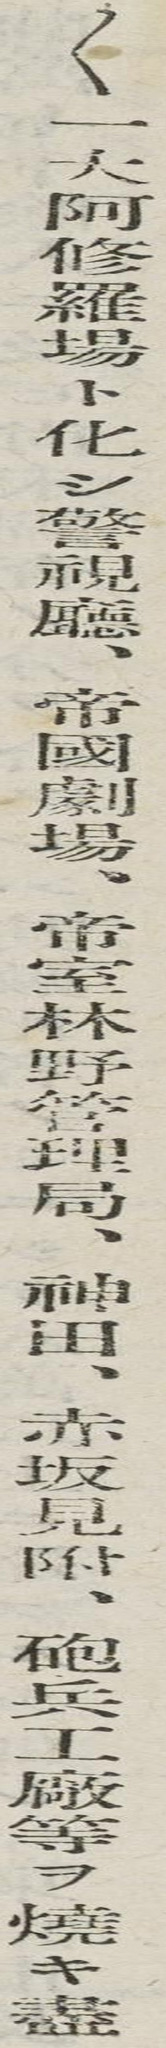〳〵一大阿修羅場ト化シ警視庁、帝国劇場、帝室林野管理局、神田、赤坂見附、砲兵工廠等ヲ焼キ尽
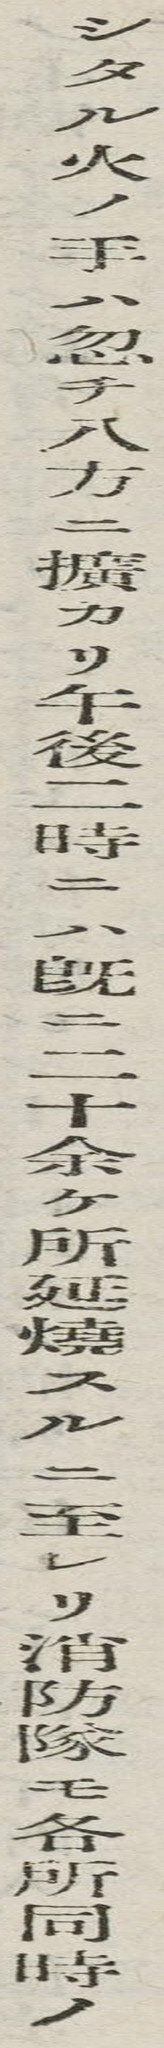シタル火ノ手ハ忽チ八方ニ拡カリ午後二時ニハ既ニ二十余ヶ所延焼スルニ至レリ消防隊モ各所同時ノ
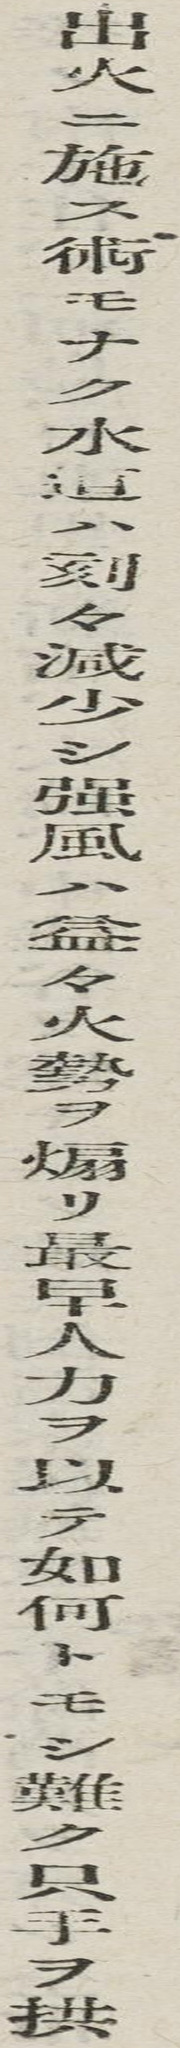出火ニ施ス術モナク水道ハ刻々減少シ強風ハ益々火勢ヲ煽リ最早人力ヲ以テ如何トモシ難ク只手ヲ拱
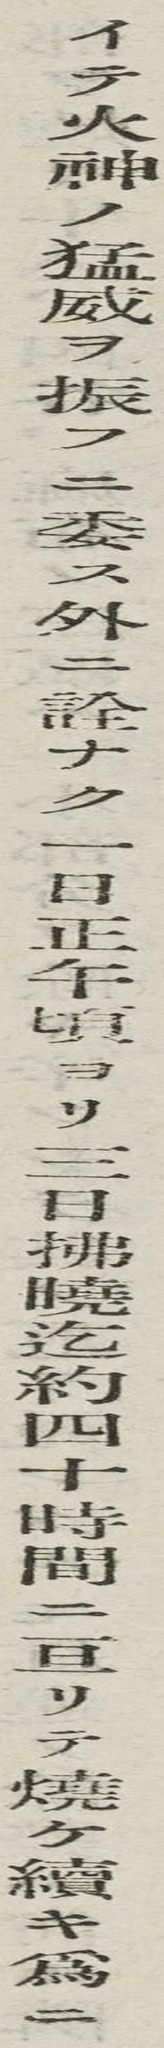イテ火神ノ猛威ヲ振フニ委ス外ニ詮ナク一日正午頃ヨリ三日払曉迄約四十時間ニ亘リテ焼ケ続キ為ニ
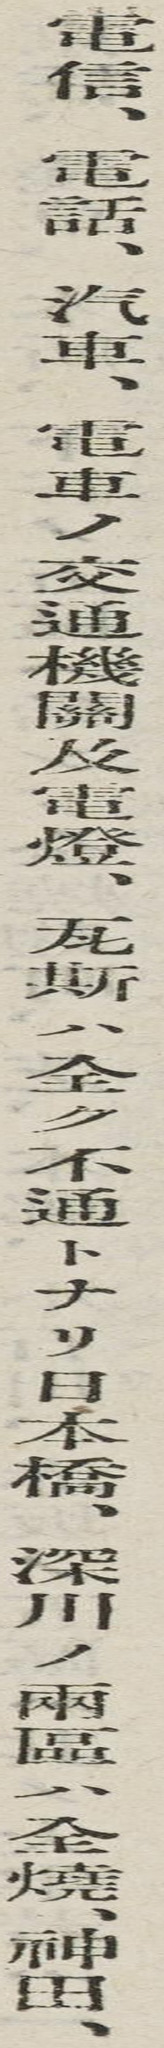電信、電話、汽車、電車ノ交通機関及電灯、瓦斯ハ全ク不通トナリ日本橋、深川ノ両区ハ全焼、神田、

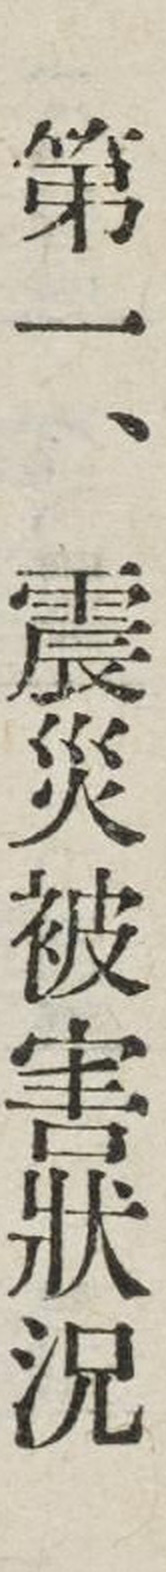第一、震災被害状況
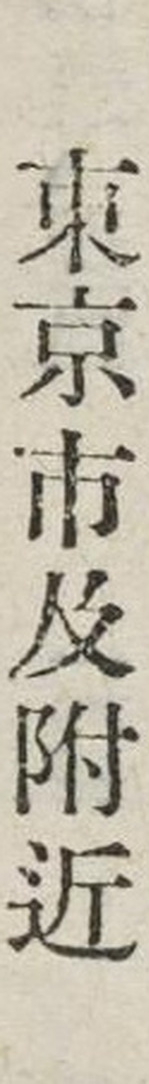１東京市及付近
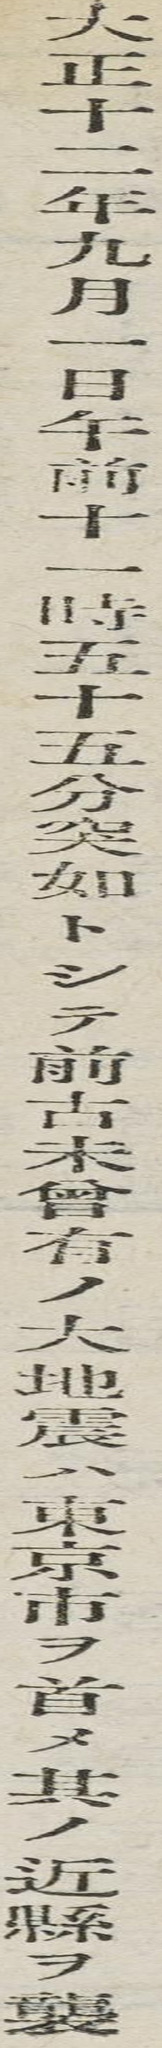大正十二年九月一日午前十一時五十五分突如トシテ前古未曾有ノ大地震ハ東京市ヲ首メ其ノ近県ヲ襲
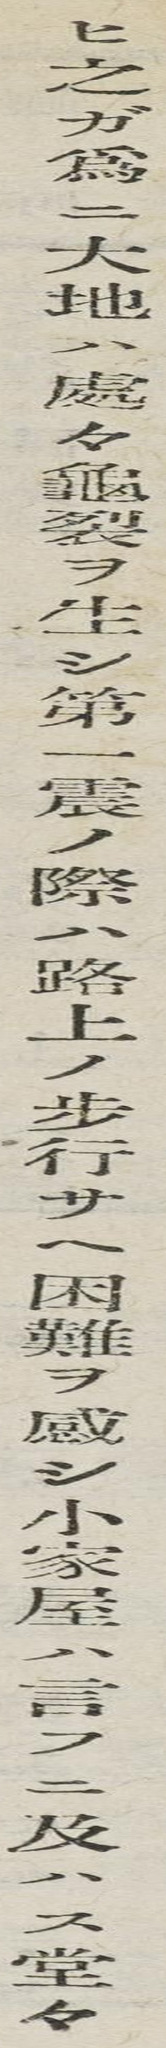ヒ之ガ為ニ大地ハ所々亀裂ヲ生シ第一震ノ際ハ路上ノ歩行サヘ困難ヲ感シ小家屋ハ言フニ及ハズ堂々
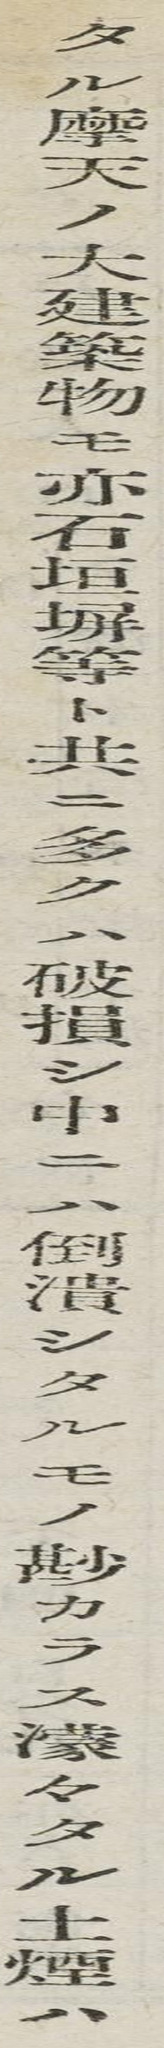タル摩天ノ大建築物亦石垣掘等ト共ニ多クハ破損シ中ニハ倒潰シタルモノ少カラス濛々タル土煙ハ
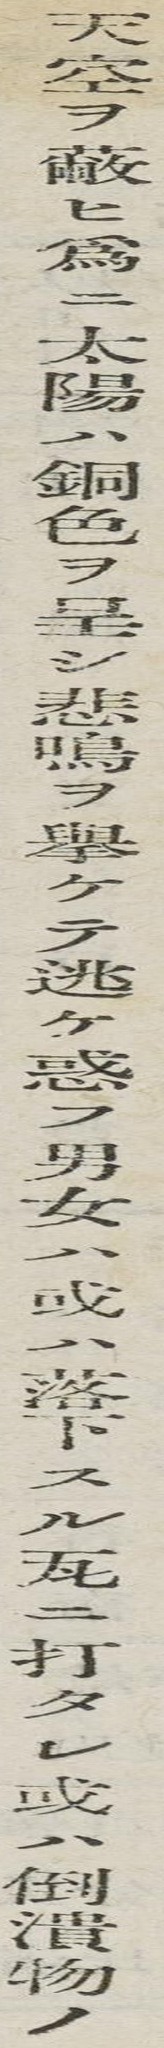天空ヲ蔽ヒ為ニ太陽ハ銅色ヲ呈シ悲鳴ヲ挙ケテ逃ケ惑フ男女ハ或ハ落下スル瓦ニ打タレ或ハ倒壊物ノ
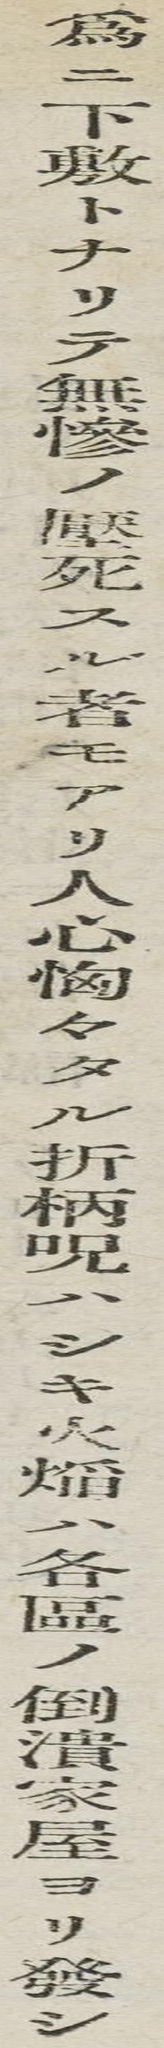為ニ下敷トナリテ無惨ノ圧死スル者アリ人心恟々タル折柄呪ハシキ変えンハ各区ノ倒壊家屋ヨリ発シ
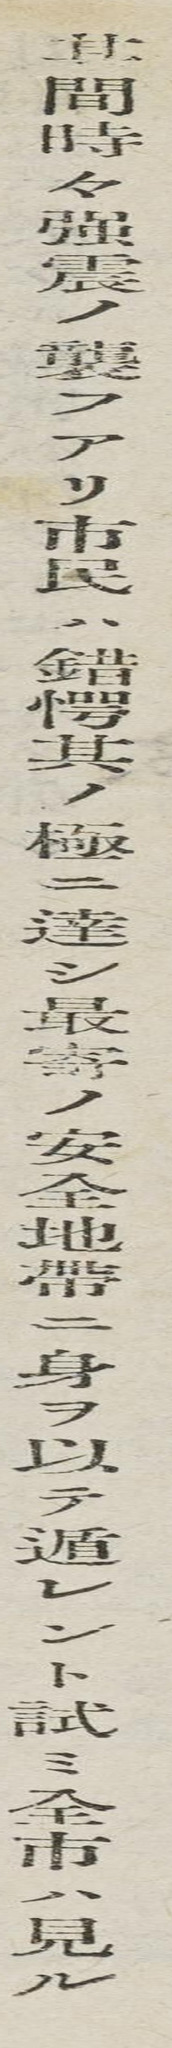其間時々強震ノ襲フアリ市民ハ錯愕其ノ極ニ達シ最寄ノ安全地帯ニ身ヲ以テ遁レント試ミ全市ハ見ル
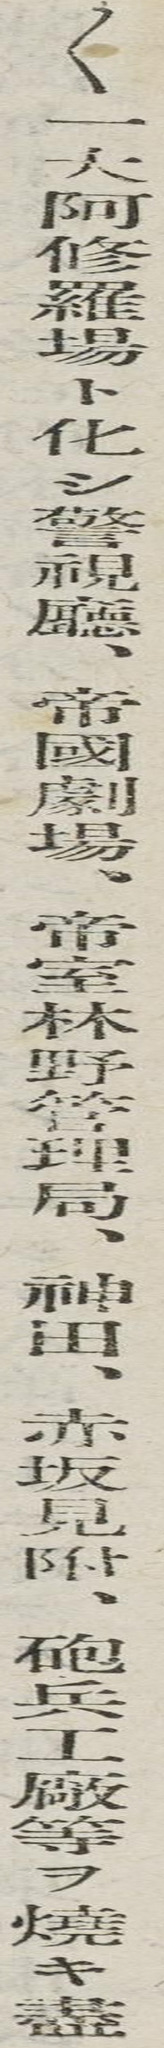〳〵一大阿修羅場ト化シ警視庁、帝国劇場、帝室林野管理局、神田、赤坂見附、砲兵工廠等ヲ焼キ盡
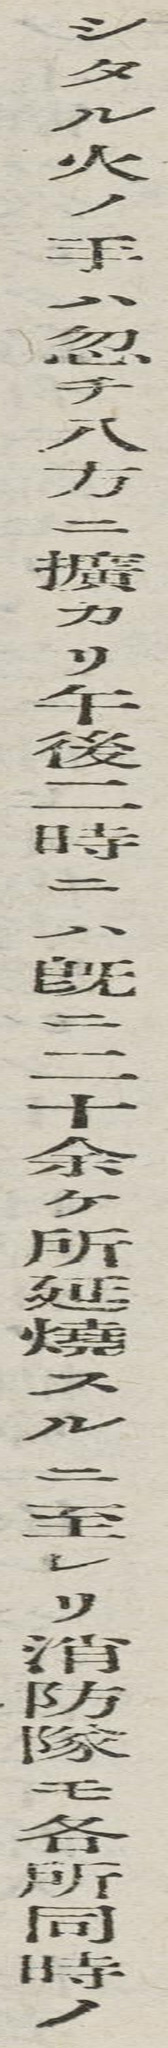シタル火ノ手ハ忽チ八方ニ広カリ午後二時ニハ既ニ二十余ヶ所延焼スルニ至レリ消防隊モ各所同時ノ
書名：震災被害状況並救護施設概要
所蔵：東京大学地震研究所図書室 Earthquake Research Institute Library, The University of Tokyo, JAPAN
